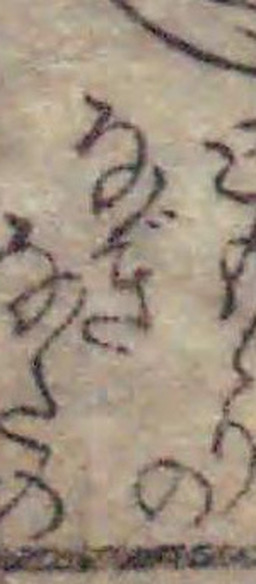なたの
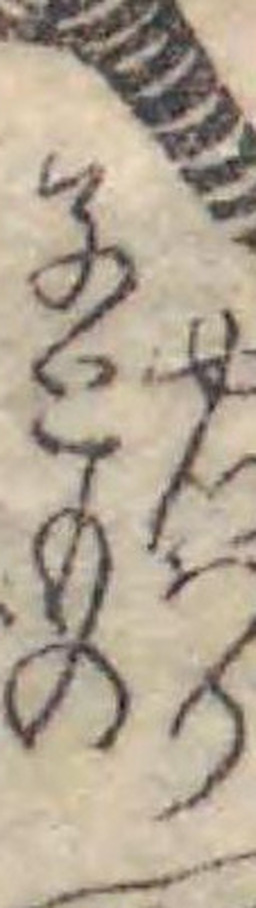子ともの
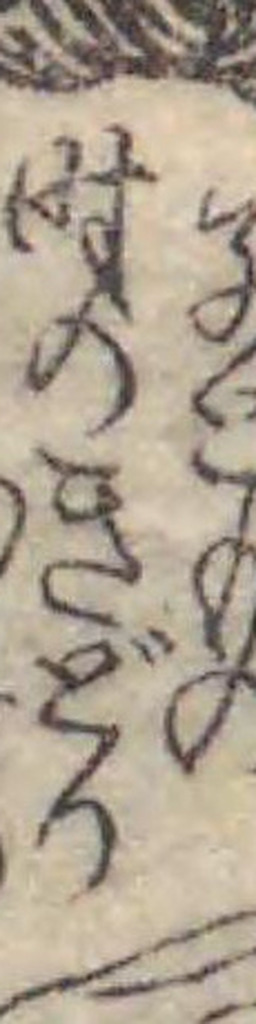時のきどり
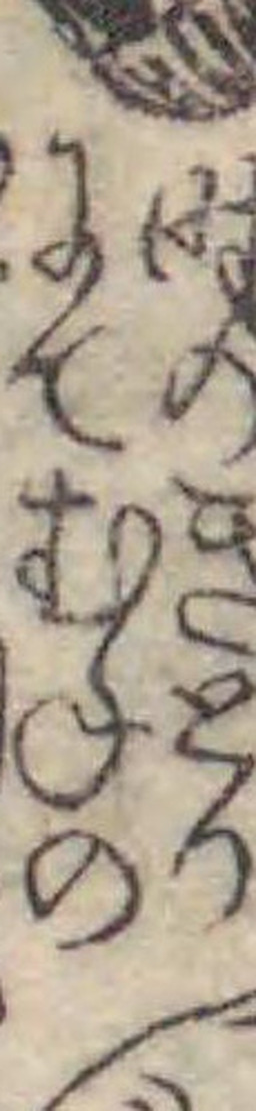にてむねの
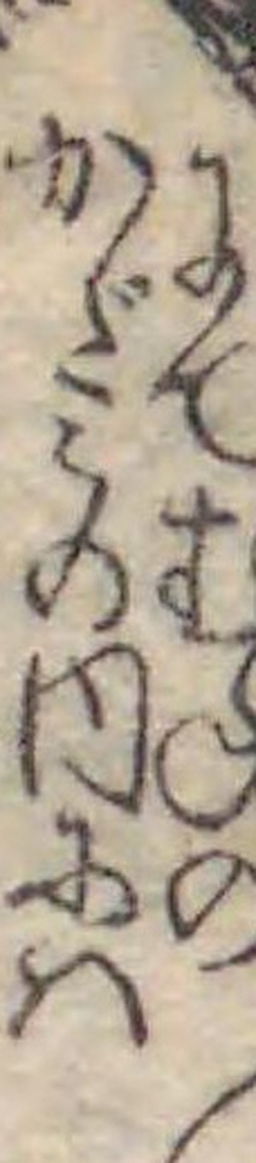かゞみの内には
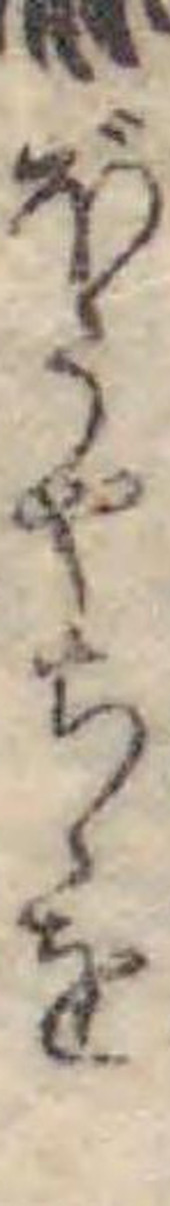ぼうやちゝを
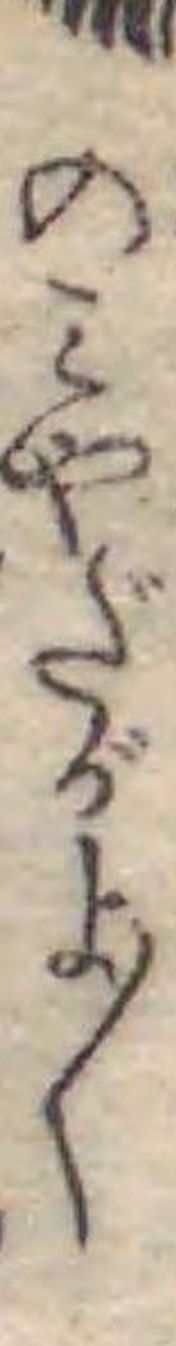のみやだがよ〳〵
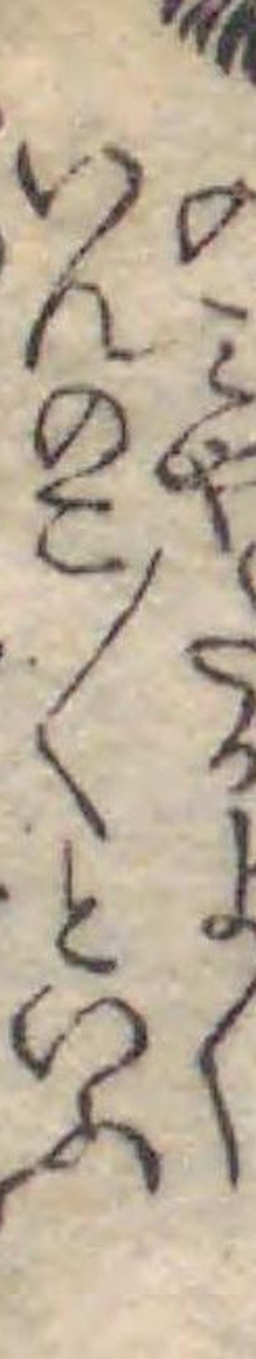いんのこ〳〵といふ
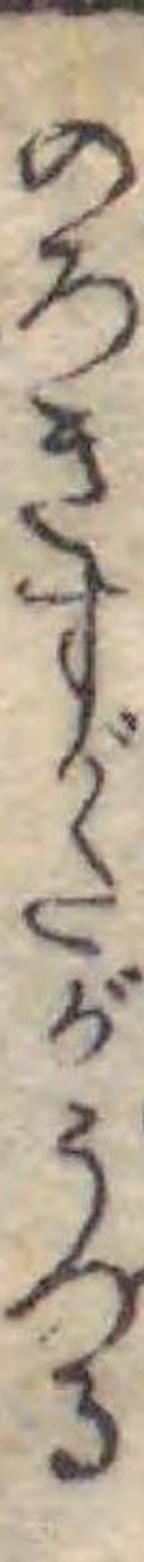のろきすがたがうつる
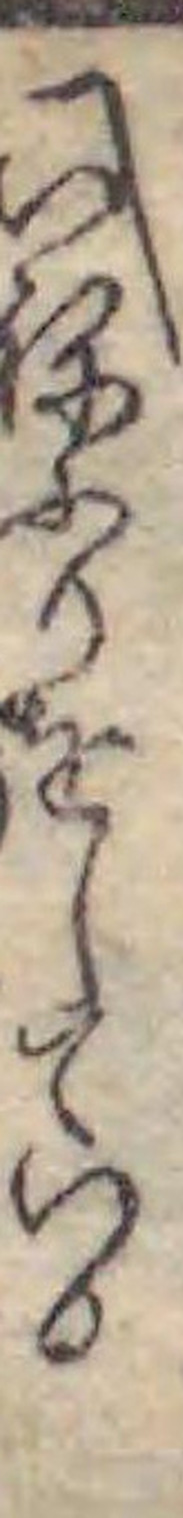〽いねふりをしている
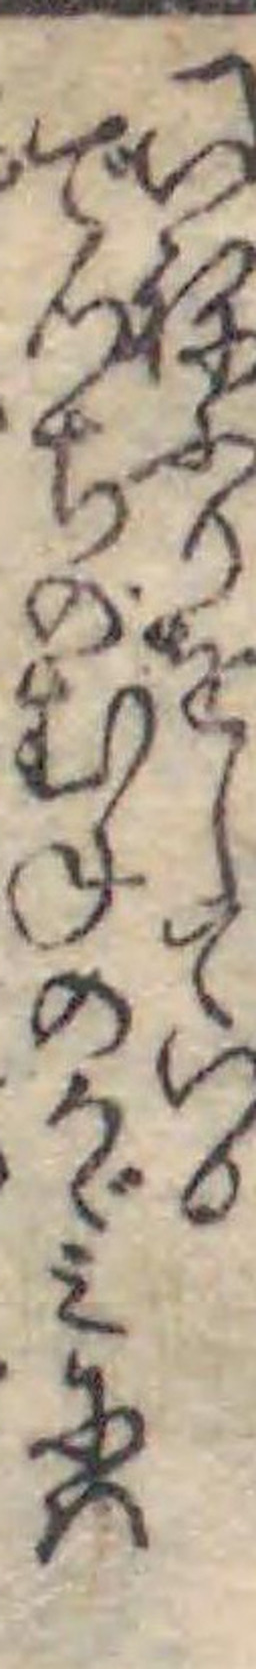でつちのむねのかゞみには
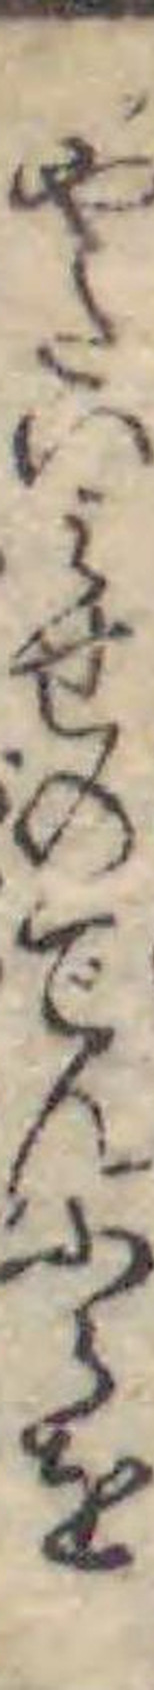やたいみせのでんふらを
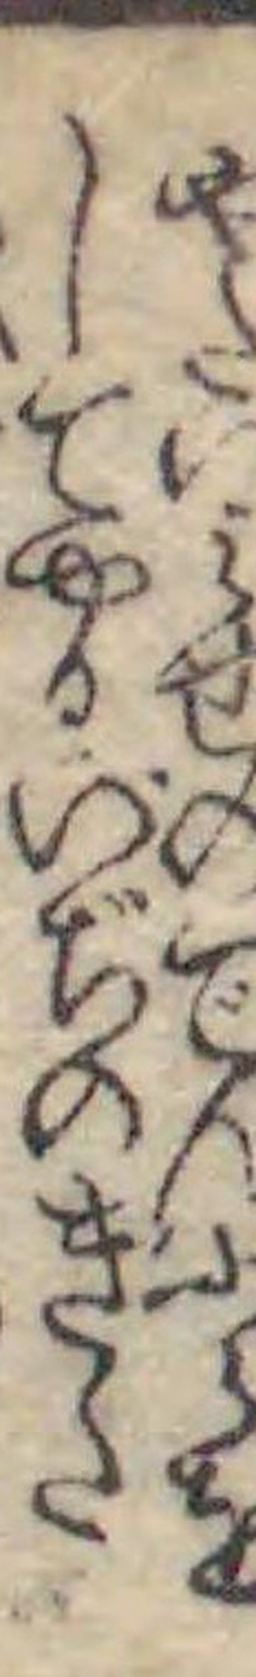してやるいぢのきた
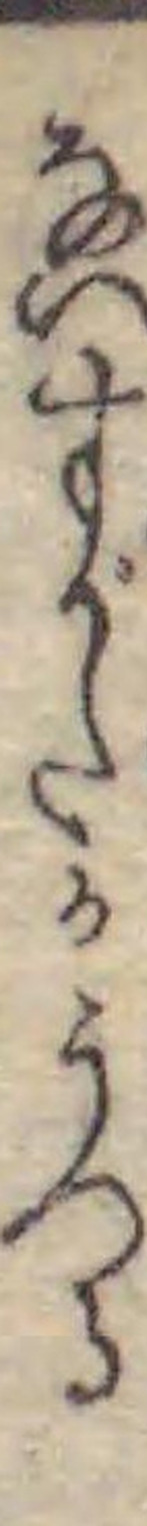ないすがたかうつる

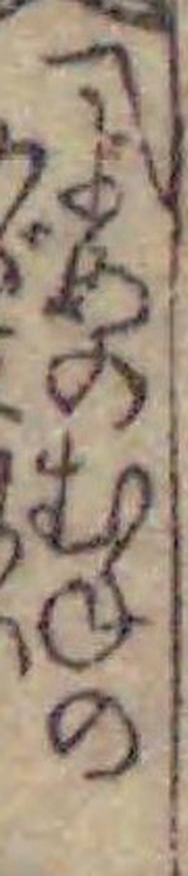〽よめのむねの
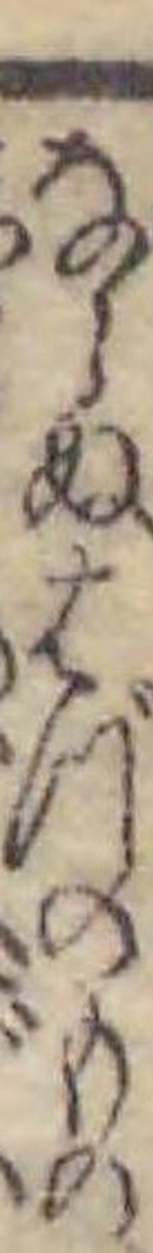ならぬはづのもの也
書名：人心鏡写絵 : 3巻
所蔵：国立国会図書館 National Diet Library, JAPAN
